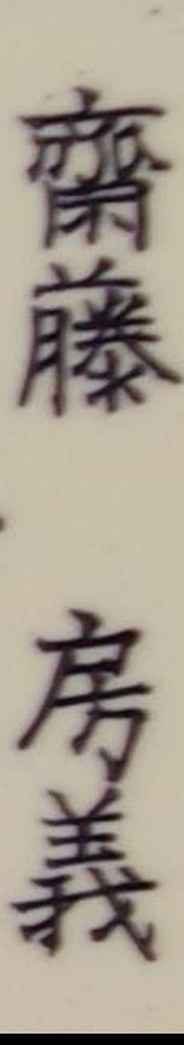斎藤房義
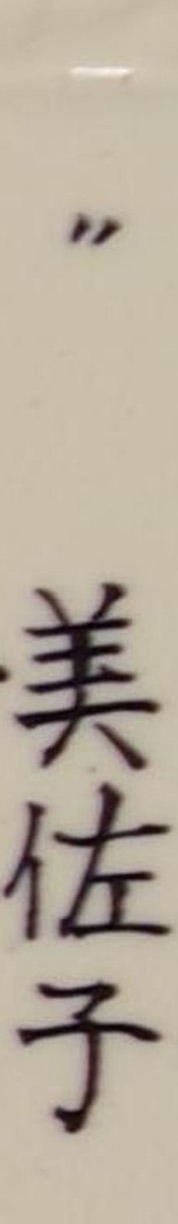美佐子
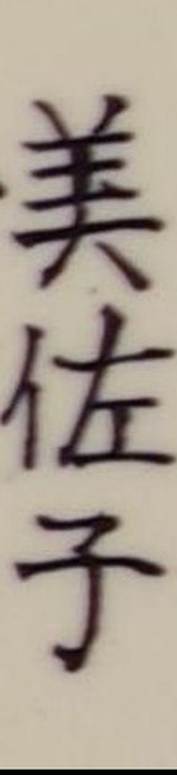美佐子
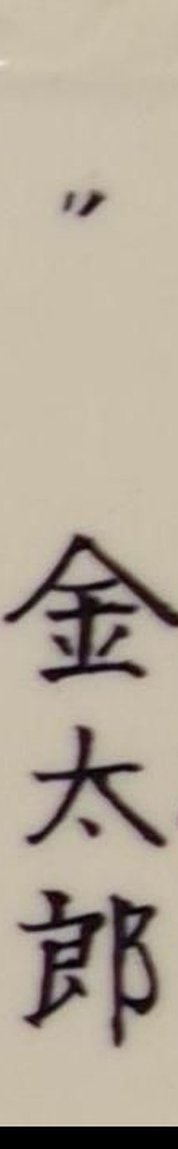金太郎
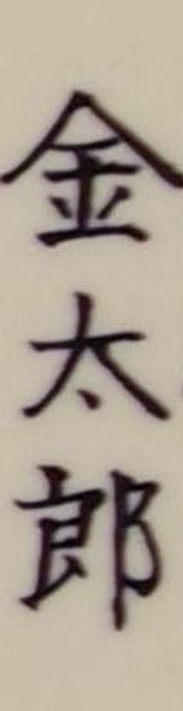金太郎
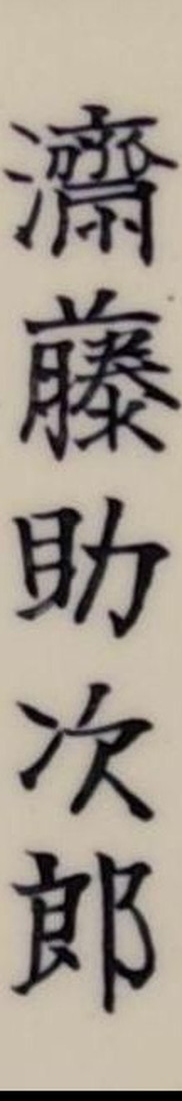濟藤助次郎
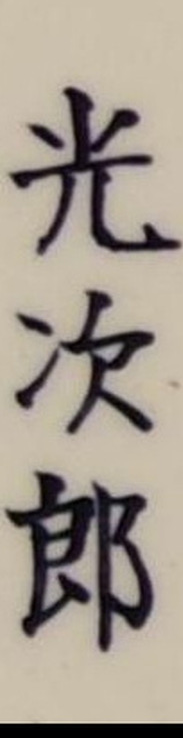光次郎
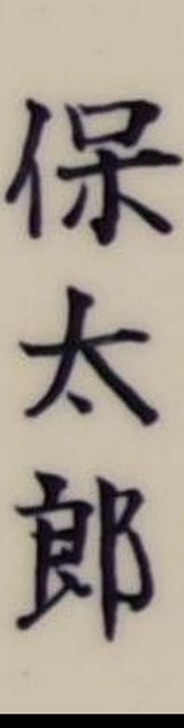保太郎
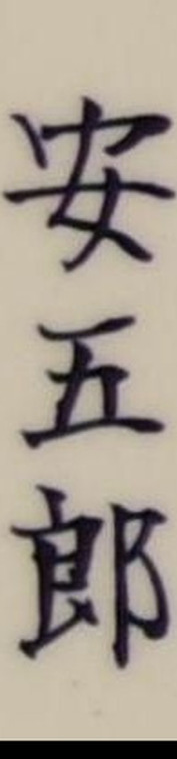安五郎

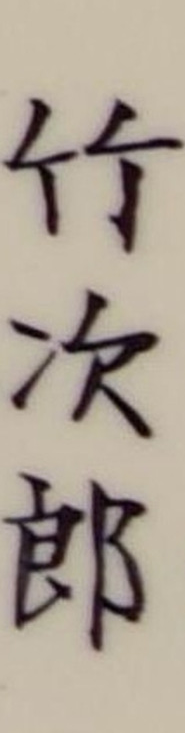竹次郎
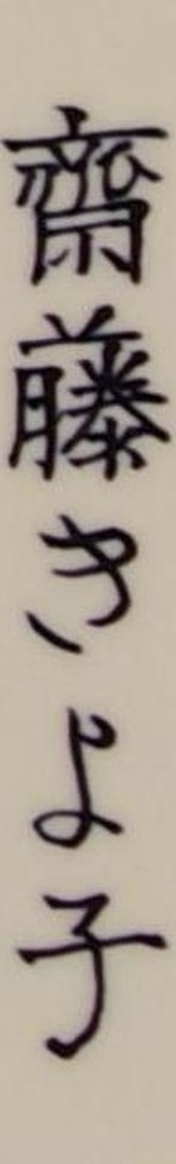齋藤きよ子
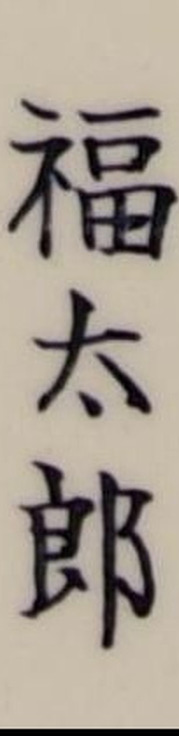福太郎
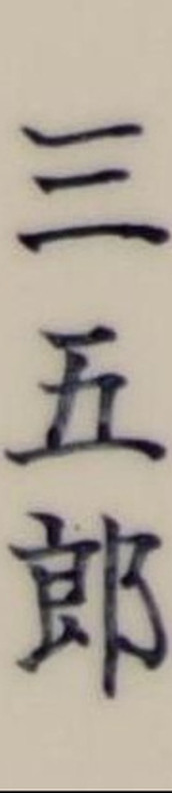三五郎

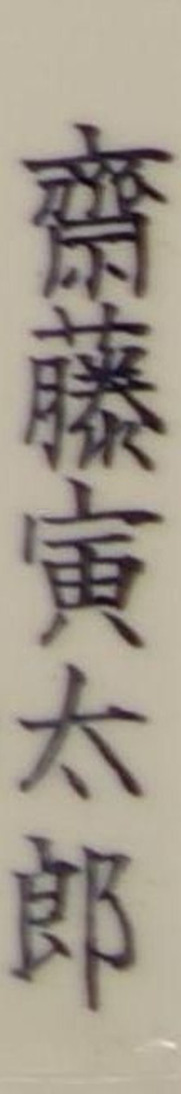齋藤寅太郎
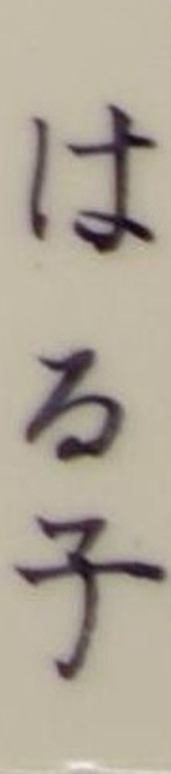はる子
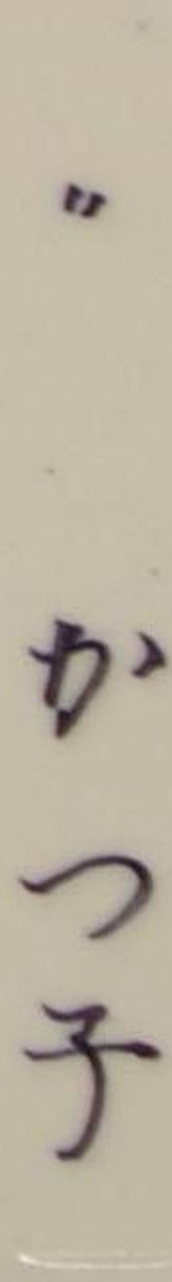かつ子
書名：E~L
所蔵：高野山金剛峯寺
